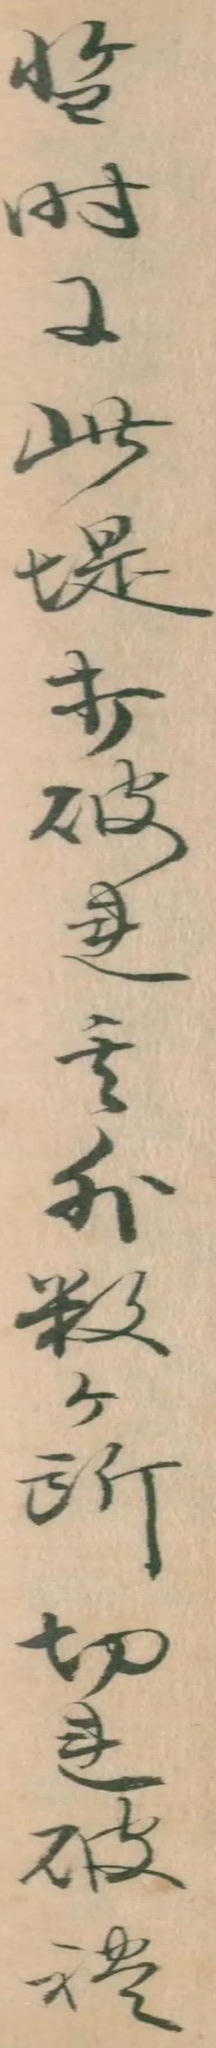暫時に此堤打破れ其外数ヶ所切れ破れ
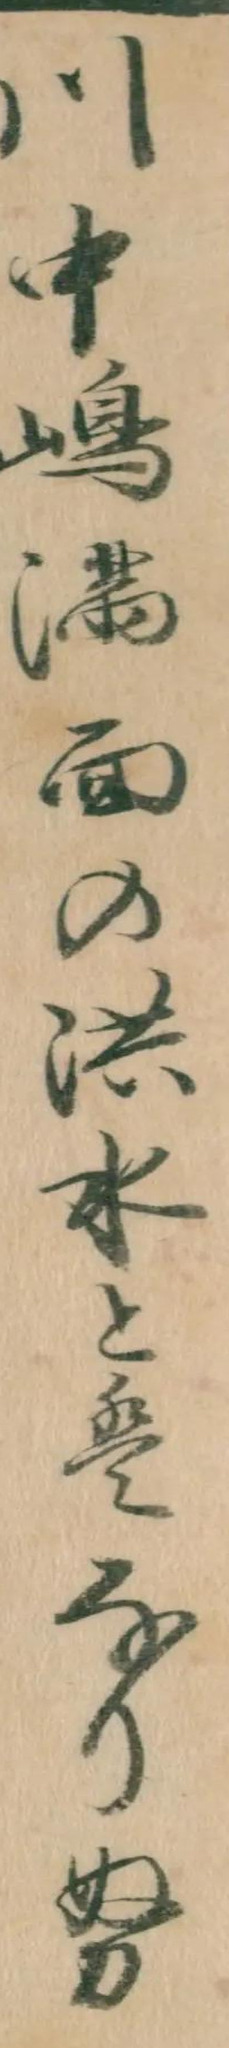川中嶋満面の洪水とはなりぬ
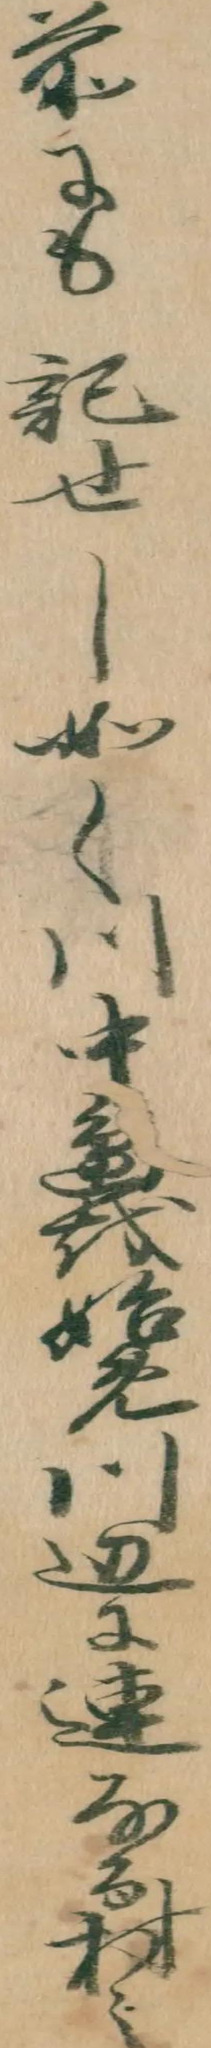前にも記せし如く川中辺を始め川辺に連なる村〻
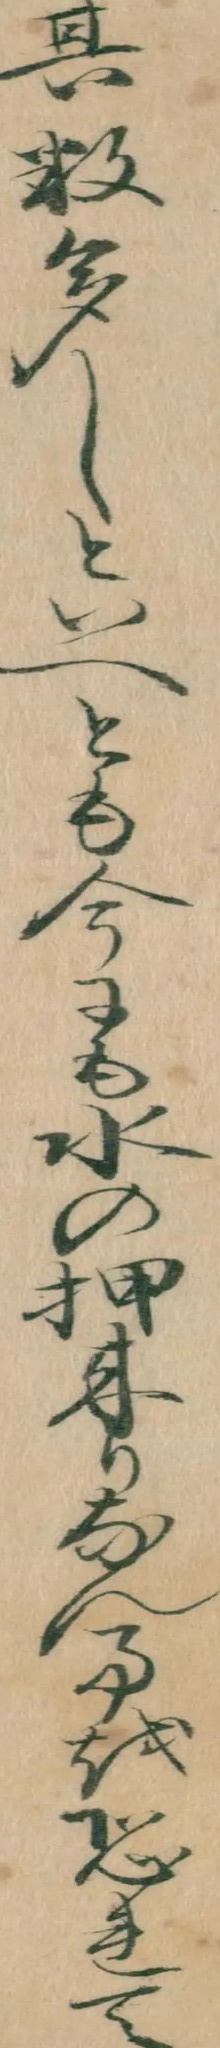其数多しといへとも今にも水の押来りなん事を恐れて
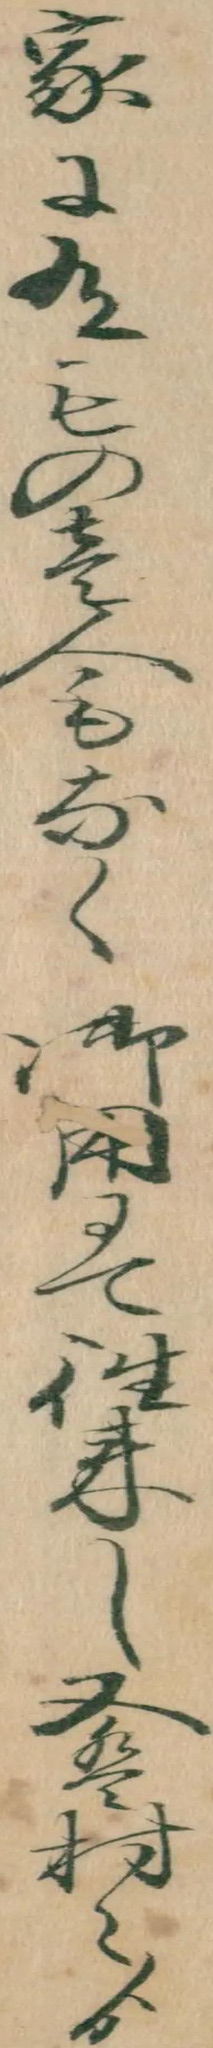家に有もの壱人もなく御用にて往来し又は村〻ゟ
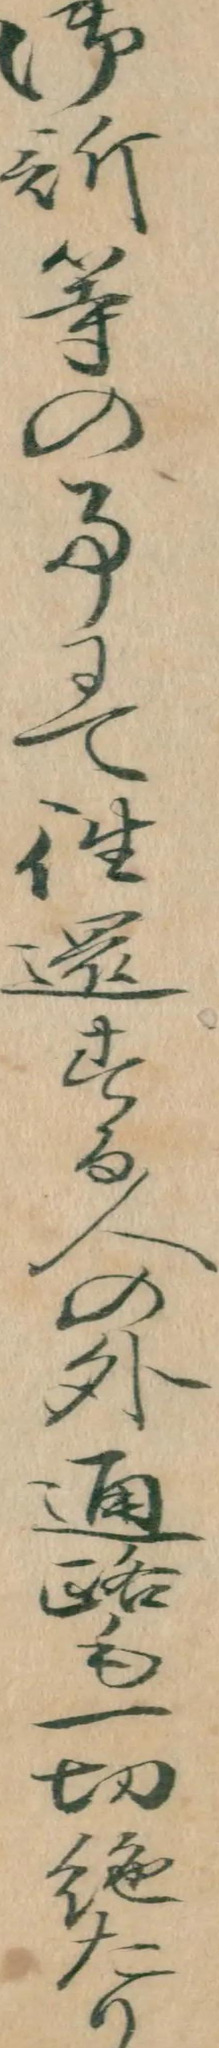御訴等の事にて往還する人の外通路も一切絶たり
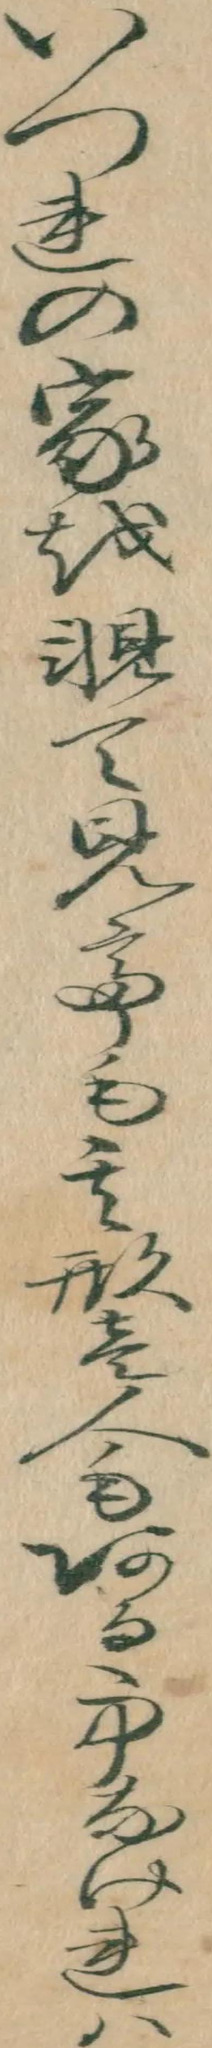いつれの家を覗て見ても其形壱人もある事なけれは
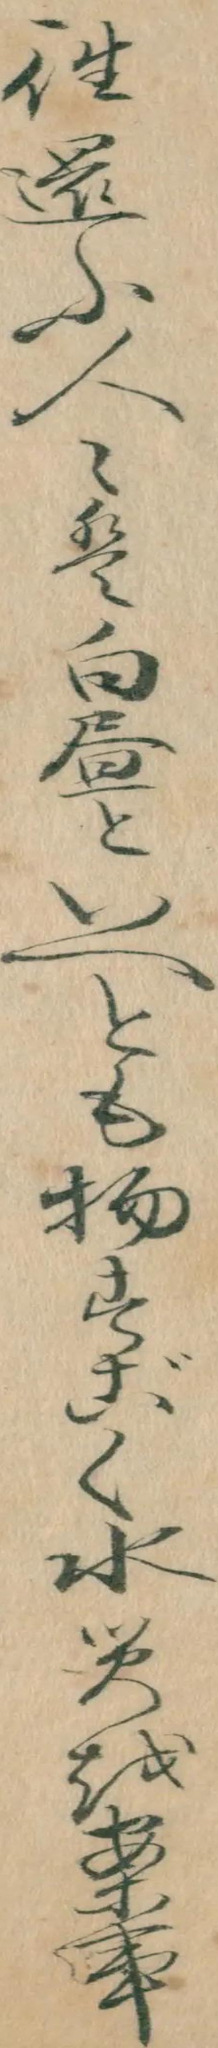往還ふ人〻は白昼といへとも物すごく水災を案事
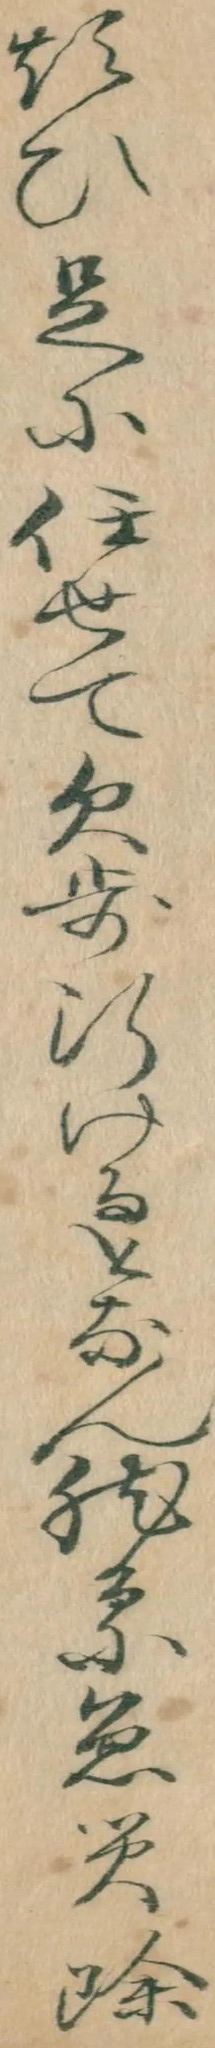煩ひ足に任せて欠歩行けるとなん然るに急災除
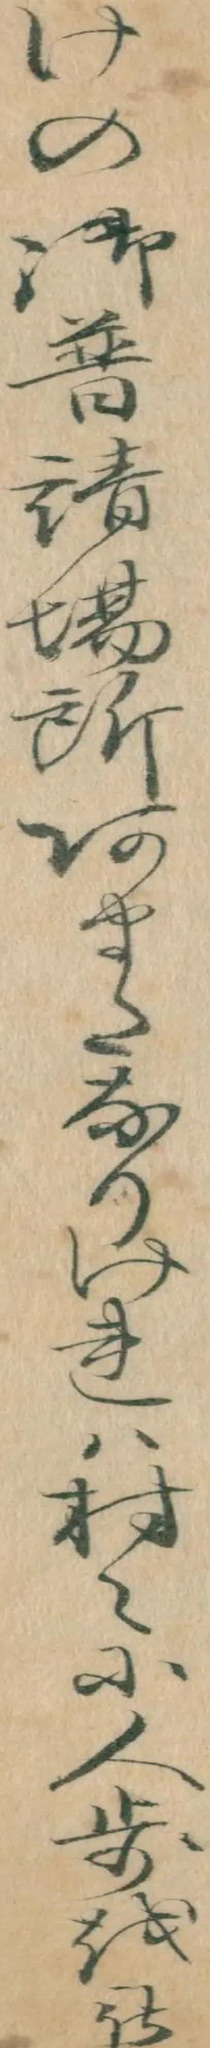けの御普請場所あまたなりけれは村〻に人歩を被
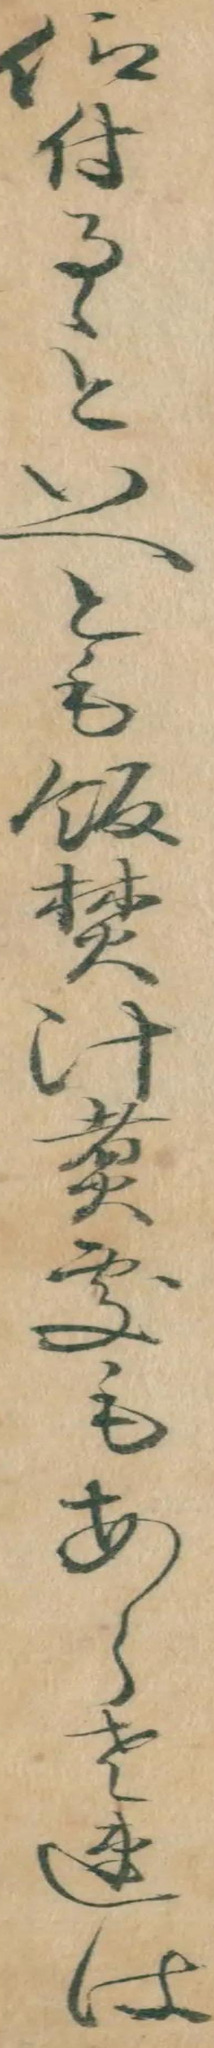仰付るゝといへとも飯焚汁煮処もあらされは

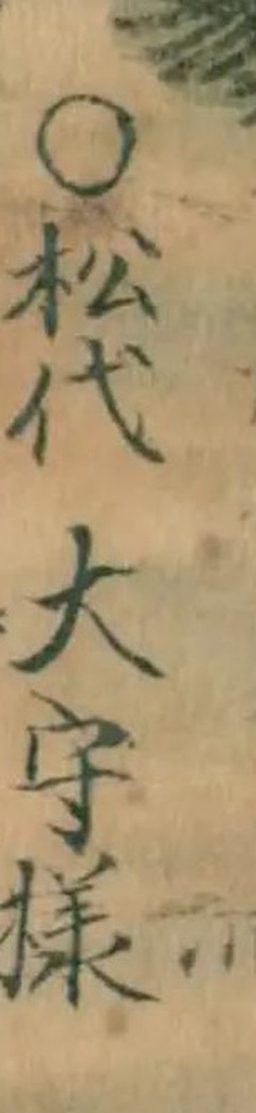○松代大守様
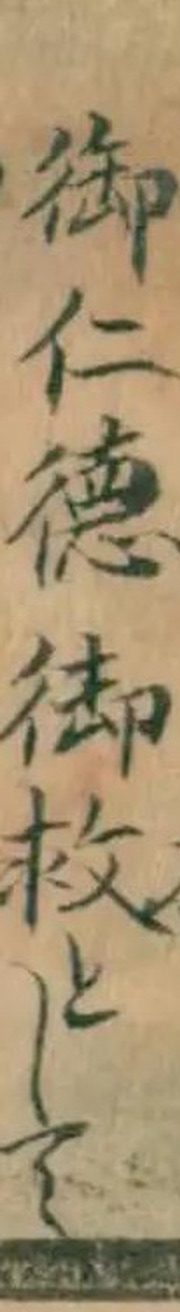御仁徳御救として
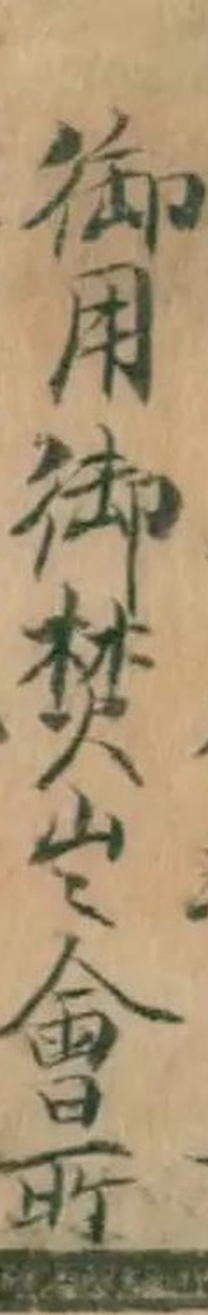御用御焚出会所
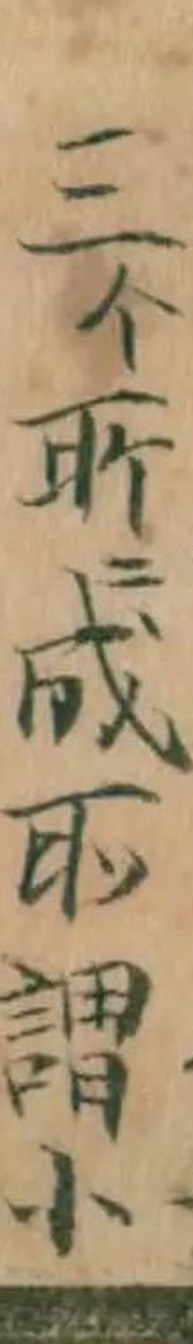三箇所ニ成所謂小
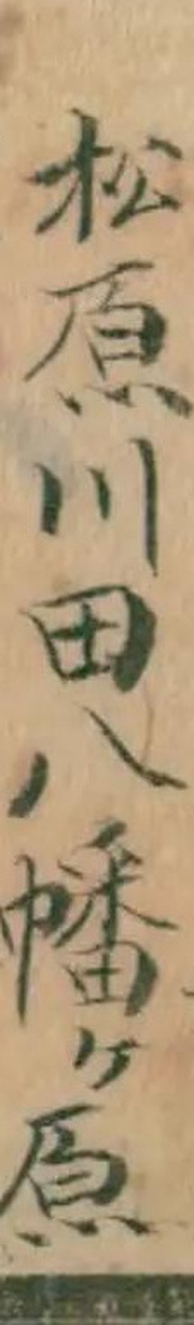松原川田八幡ケ原
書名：俗語之種. [6]
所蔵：国立国会図書館 National Diet Library, JAPAN
